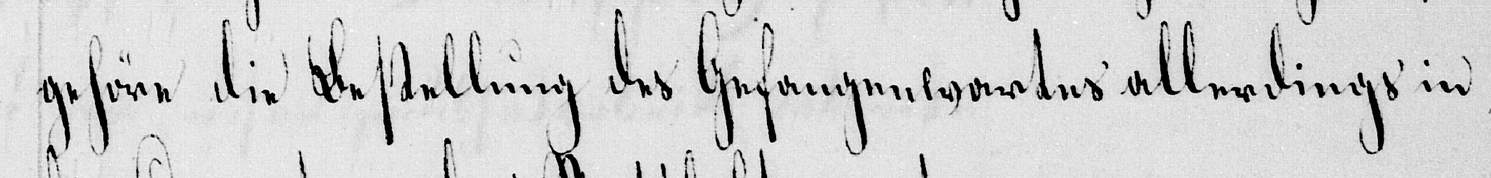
gehöre die Bestellung des Gefangenwartes allerdings in
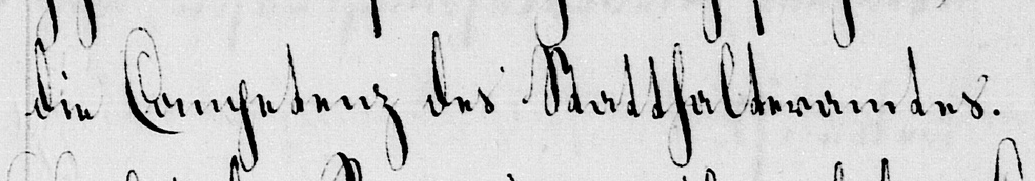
die Competenz des Statthalteramtes.
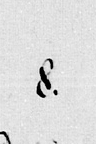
d.
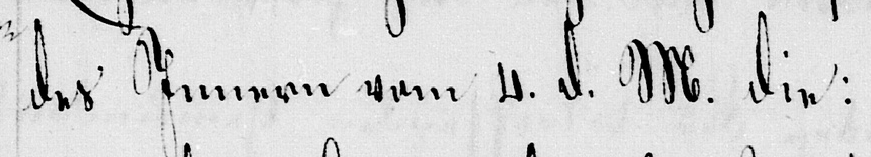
des Innern vom 4. d. M. die:
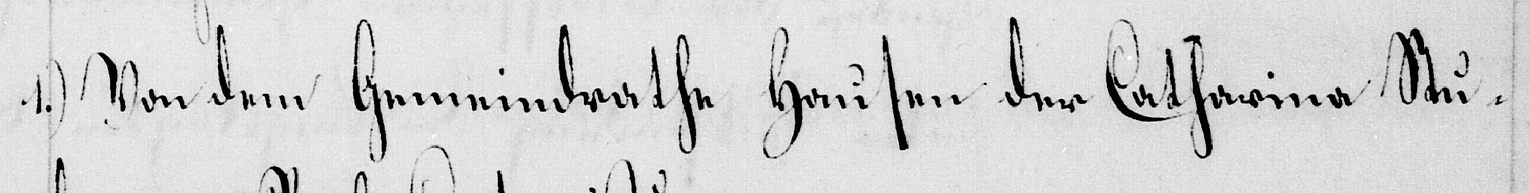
1.) Von dem Gemeindrathe Hausen der Catharina Stu¬
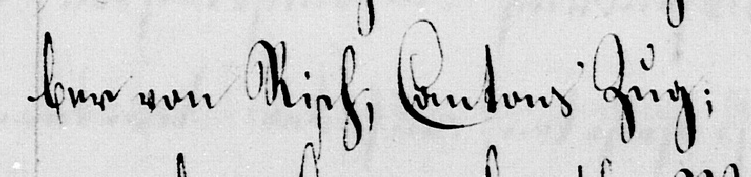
ber von Kipf, Cantons Zug;
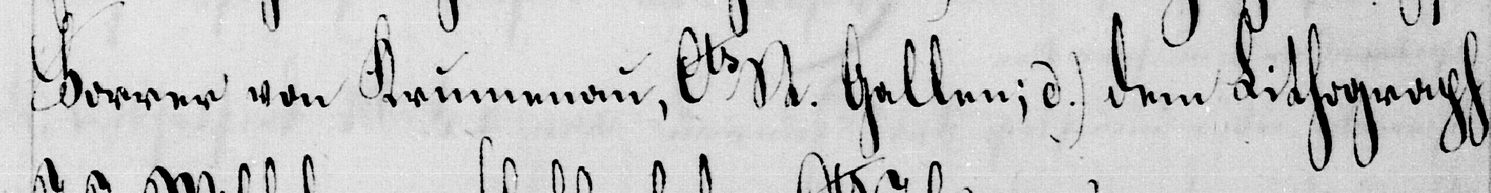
Forrer von Krumenau, Cts. St. Gallen; d.) dem Lithograph
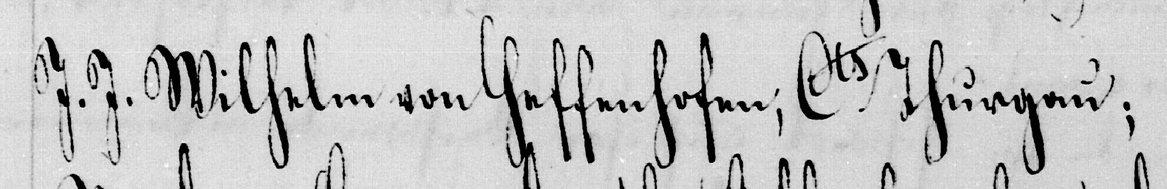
J. J. Wilhelm von Heffenhofen, Cts. Thurgau:
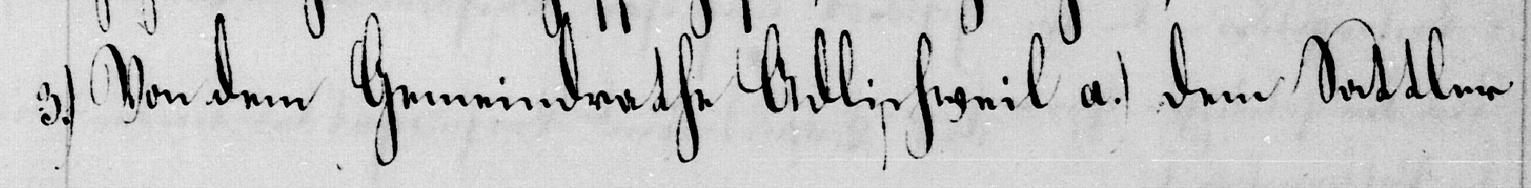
3.) Von dem Gemeindrath Adlischweil a.) dem Sattler
